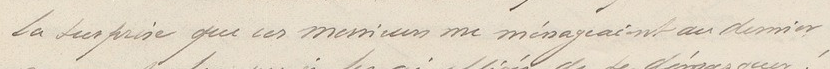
la surprise que ces Messieurs me ménageaient au dernier
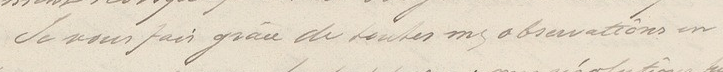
Je vous fais grâce de toutes mes observations en
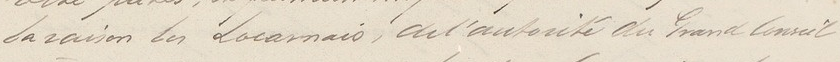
la raison les Locarnais, de l'autorité du Grand Conseil
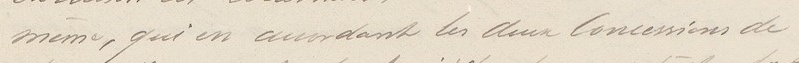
même, qui en accordant les deux Concessions de
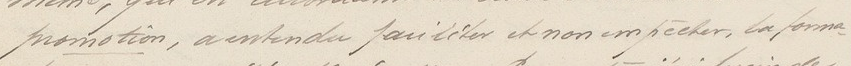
promotion, a entendu faciliter et non empêcher, la forma-
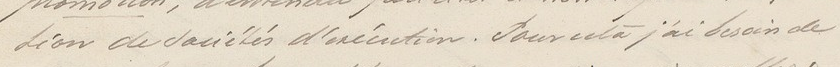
tion de sociétés d'exécution. Pour celà j'ai besoin de
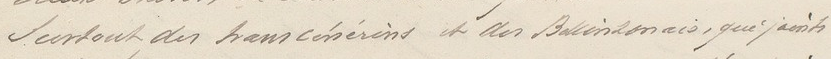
surtout des transcénérins et des Bellinzonais, qui joints
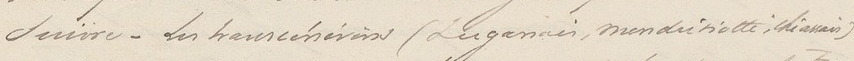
suivre – Les transcénérins (Luganais, Mendrisiotti, Chiassais)
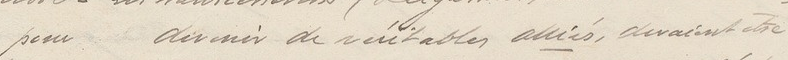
pour devenir de véritables alliés, devaient être
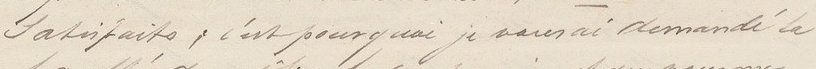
satisfaits; c'est pourquoi je vous ai demandé la
